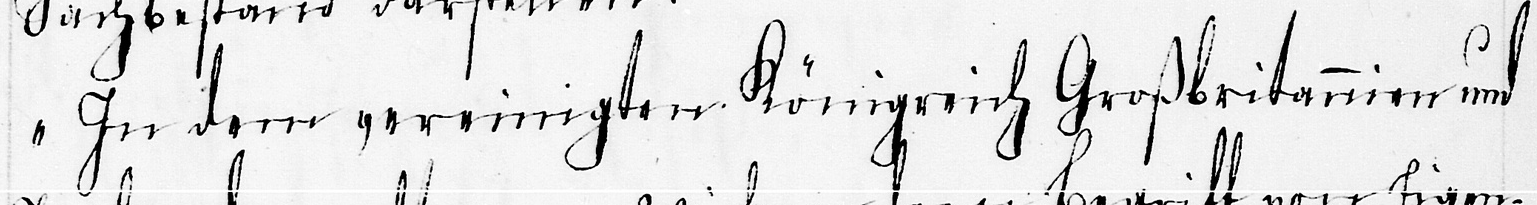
„In dem vereinigten Königreich Großbritannien und
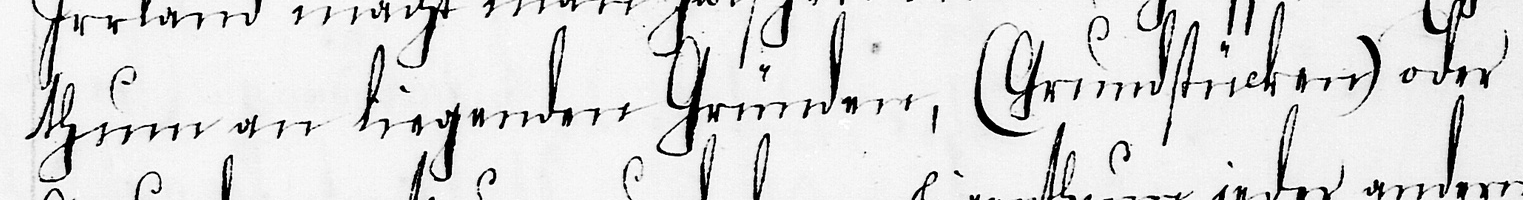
thum an liegenden Gründen, (Grundstücken) oder
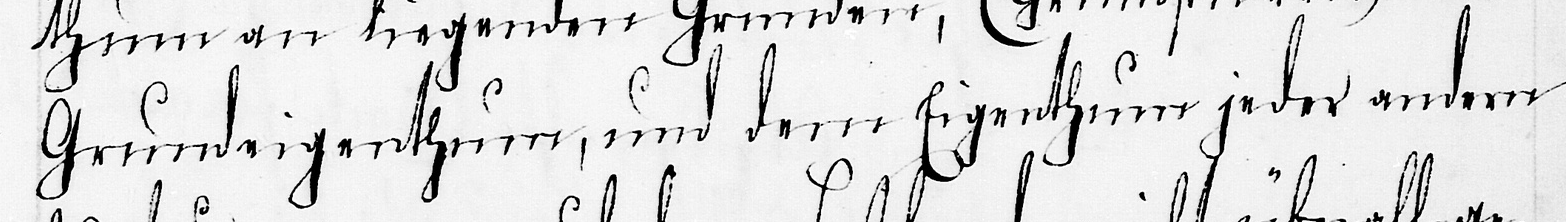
Grundeigenthum, und dem Eigenthum jeder andern
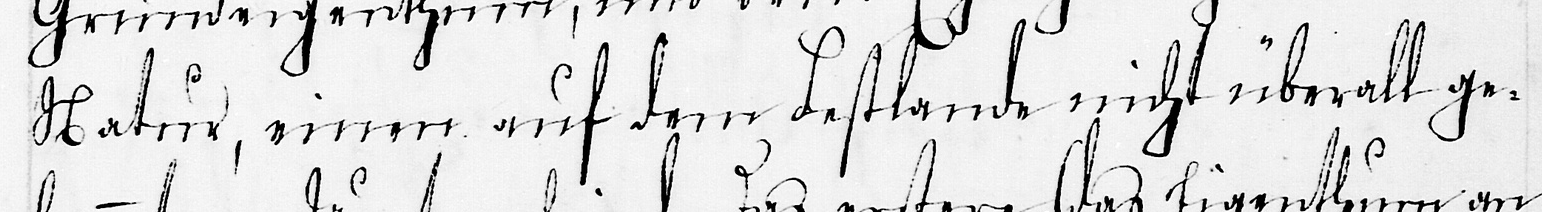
Natur, einen auf dem Festlande nicht überall ge¬
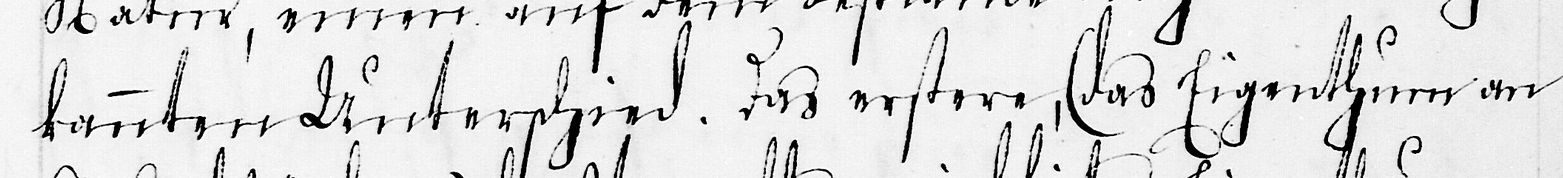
kannten Unterschied. Das erstere, (das Eigenthum an
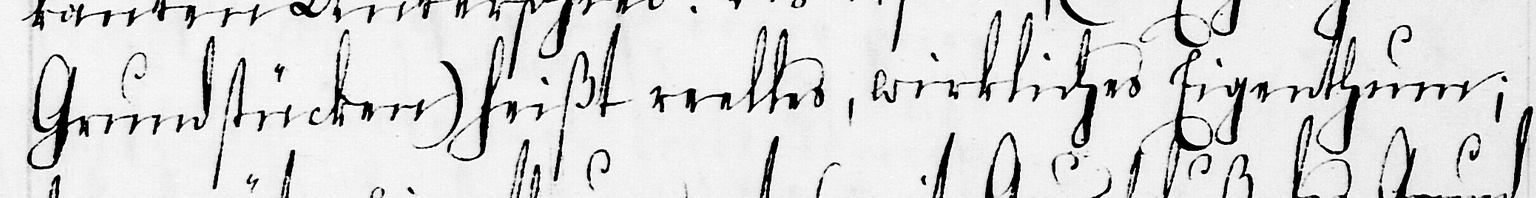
Grundstücken) heißt reelles, wirkliches Eigenthum;
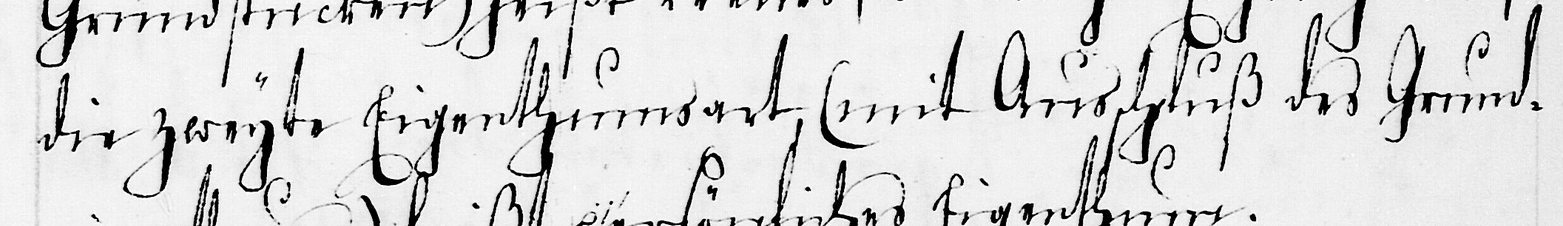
die zweyte Eigenthumsart, (mit Ausschluß des Grund¬
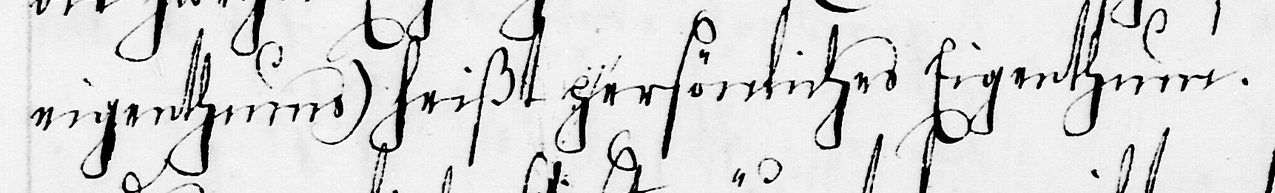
eigenthums) heißt persönliches Eigenthu¬
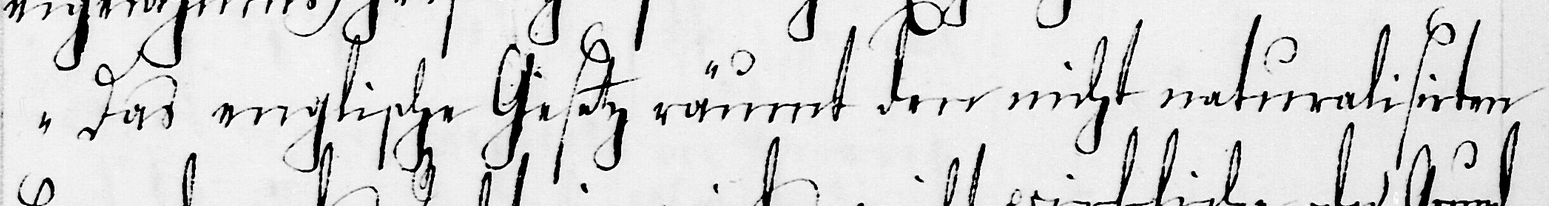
„Das englische Gesetz räumt den nicht naturalisirten
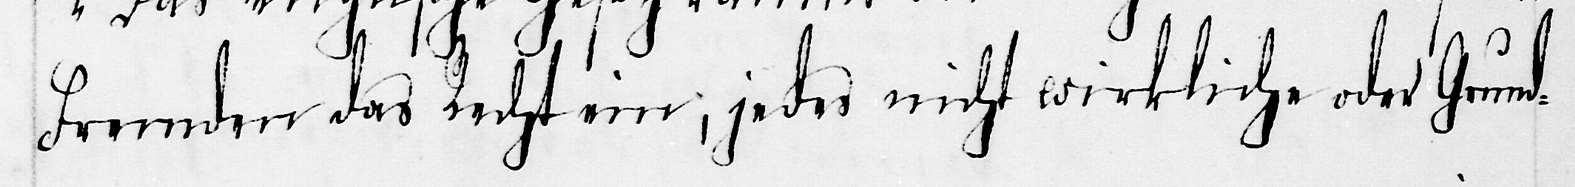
Fremden das Recht ein, jedes nicht wirkliche oder Grund-
